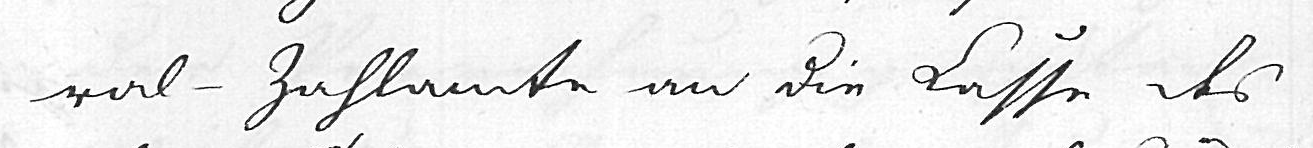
ral-Zahlamte an die Casse des
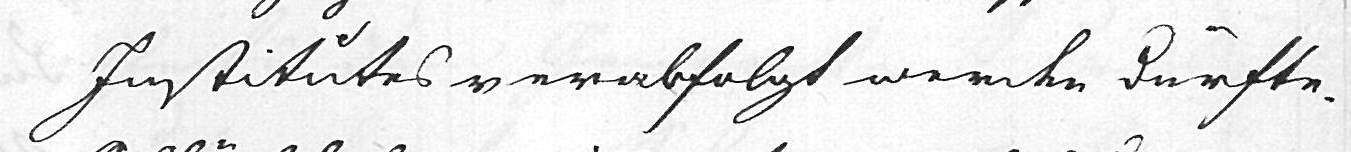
Institutes verabfolgt werden dürfte.
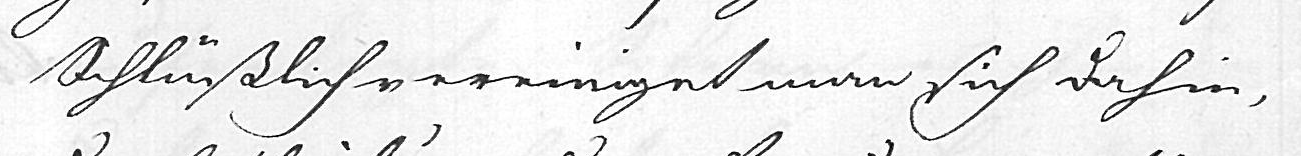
Schlüßlich vereinget man sich dahin,
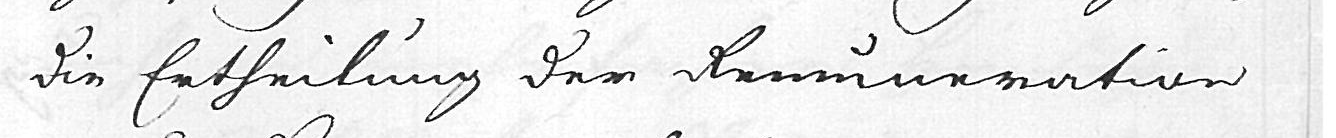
die Ertheilung der Remuneration
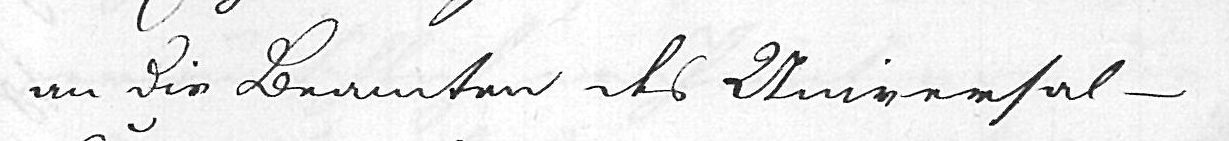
an die Beamten des Universal-
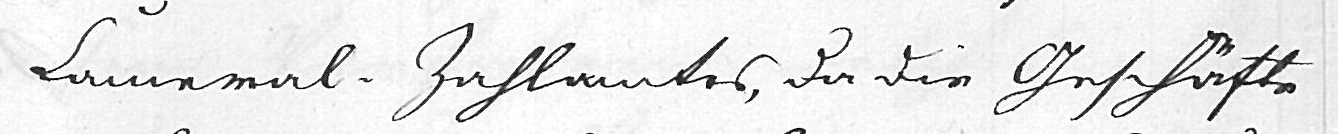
Cameral-Zahlamtes, da die Geschäfte
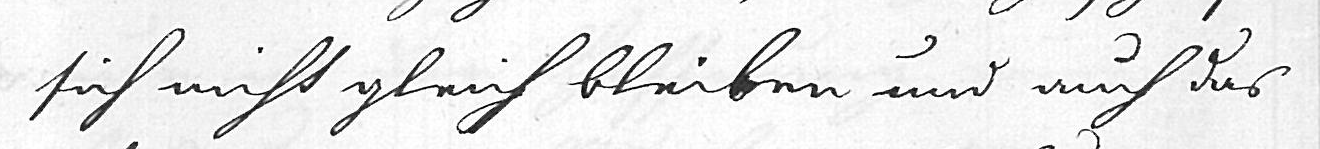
sich nicht gleich bleiben und auch das
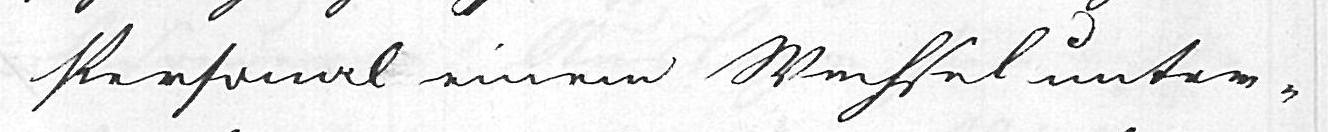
Personal einem Wechsel unter-
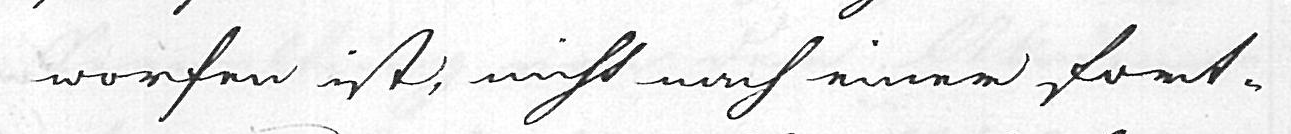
worfen ist, nicht nach einer fort-
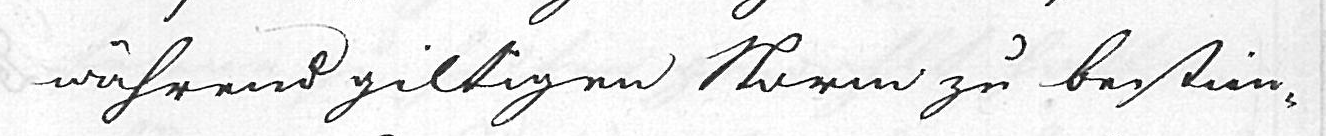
während giltigen Normen zu bestim-
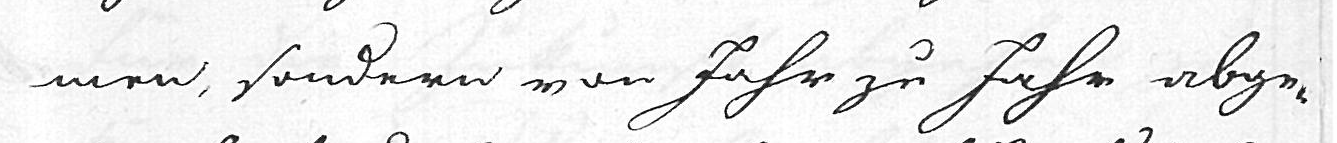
men, sondern von Jahr zu Jahre abge-
